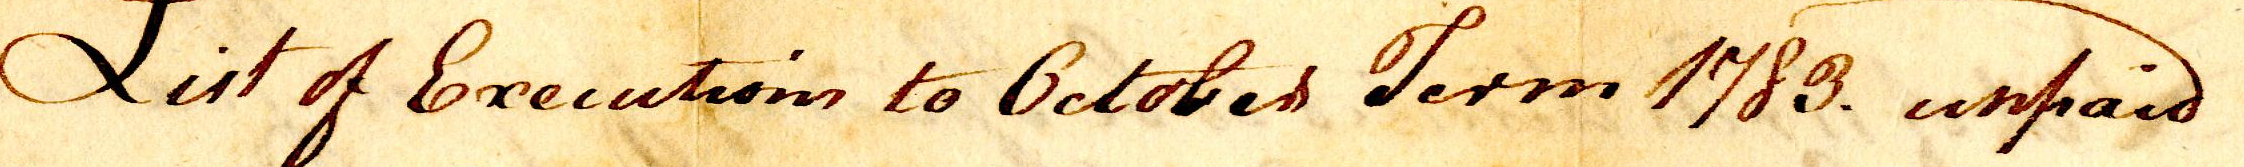List of Executions to October Term 1783. unpaid
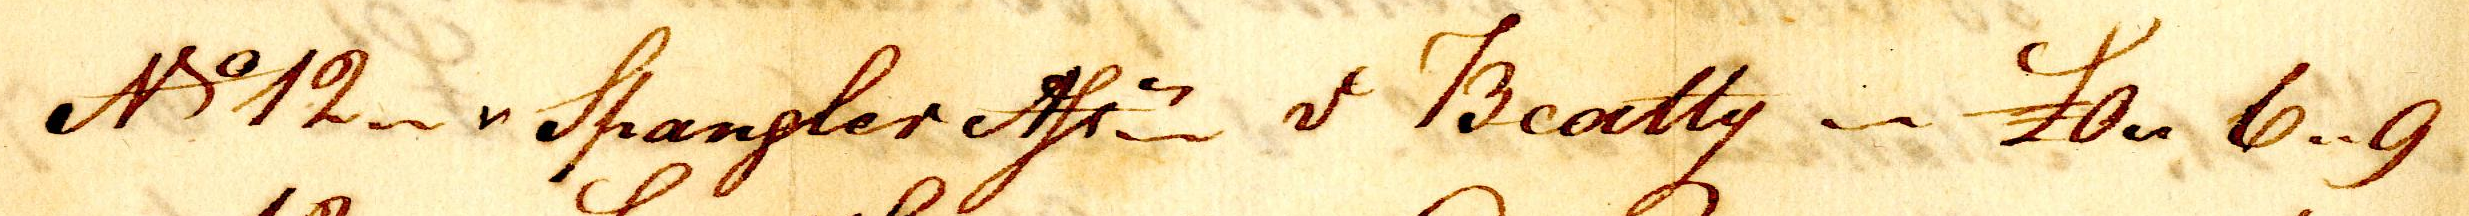N^o 12 Spangler Ass^er v Bealty - £0.. 6..9
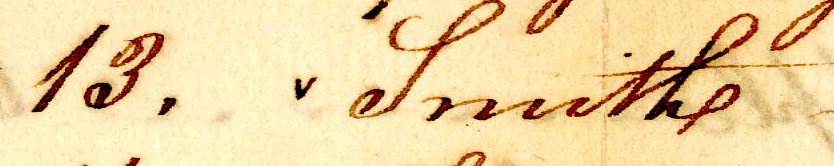13. v Smith
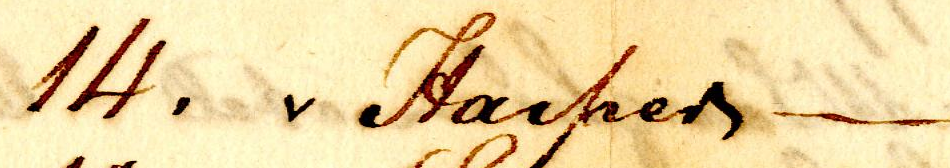14. v Harper
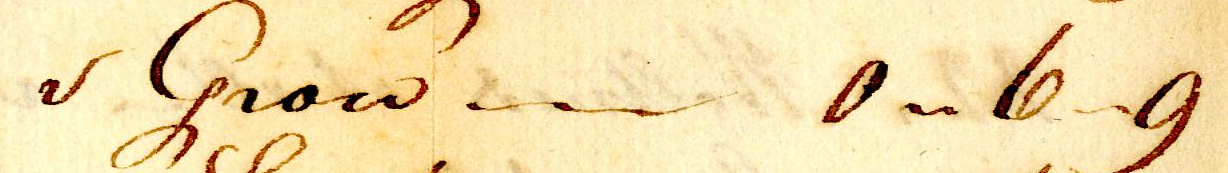v Grow- 0..6..9
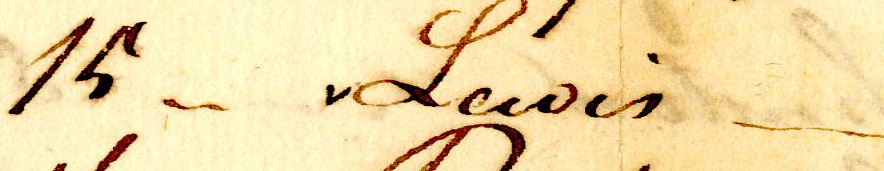15. Lewis
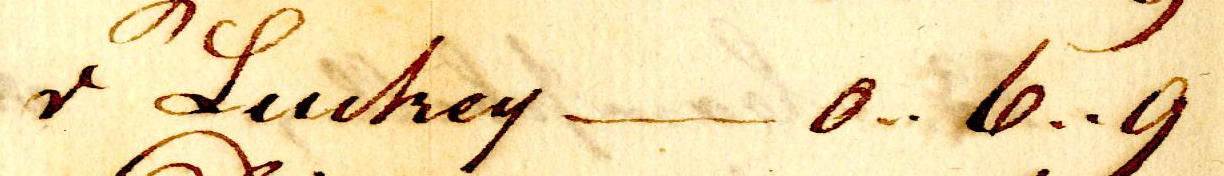v Luckey- 0..6.. 9
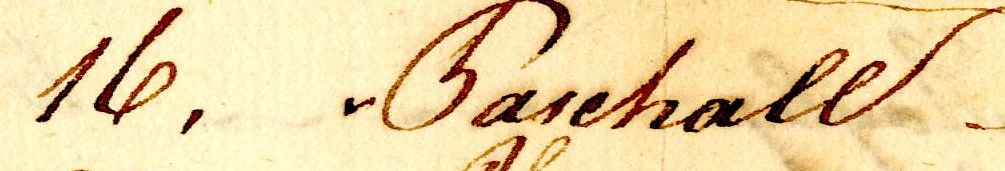16. Baschall
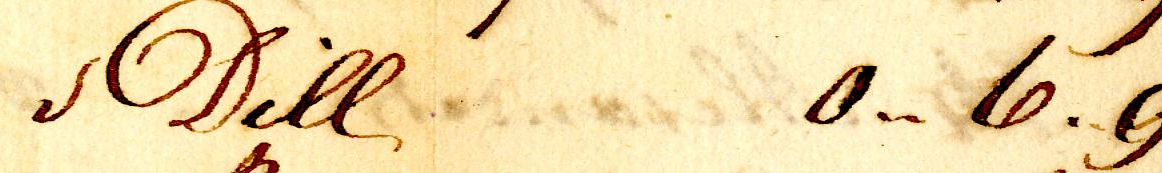v Dill O.6.9
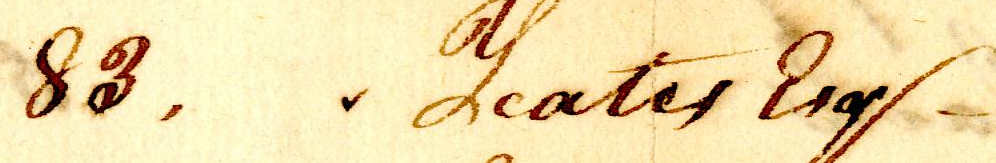83. v Yeates Esq^
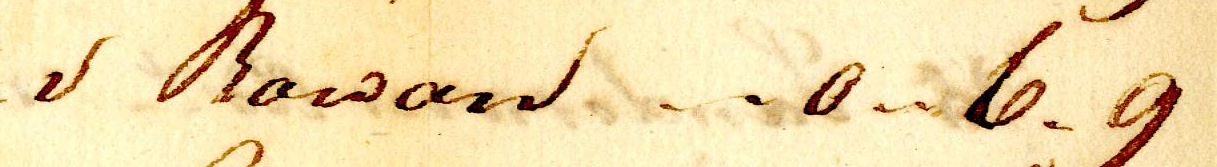v Rowand - 0. 6. 9
